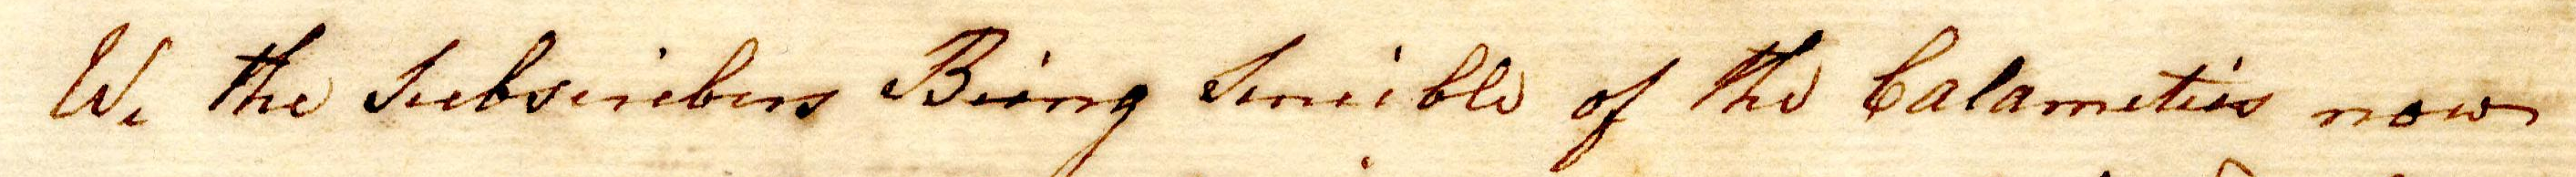We the Subscribers Being Sensible of the Calamities now
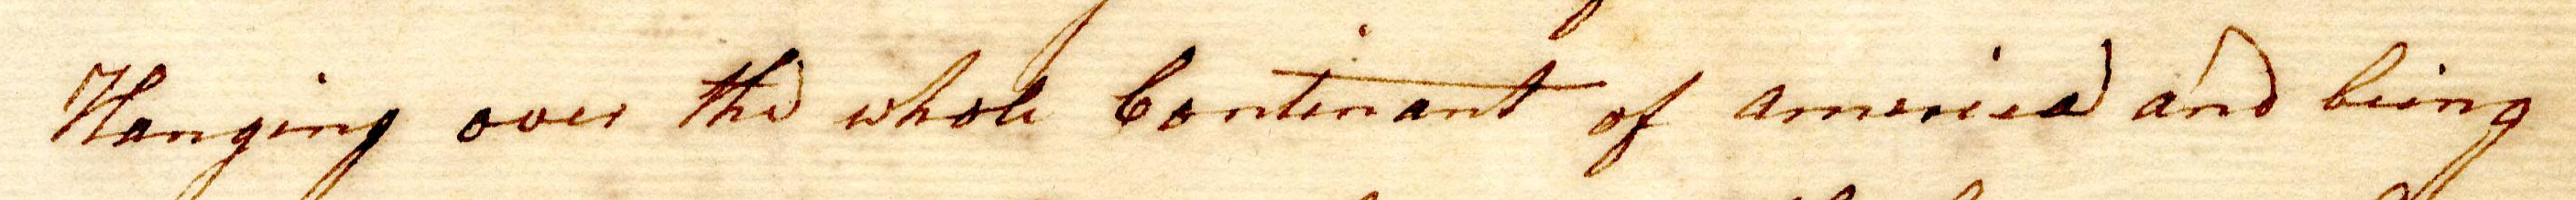Hanging over the whole Continant of America and being
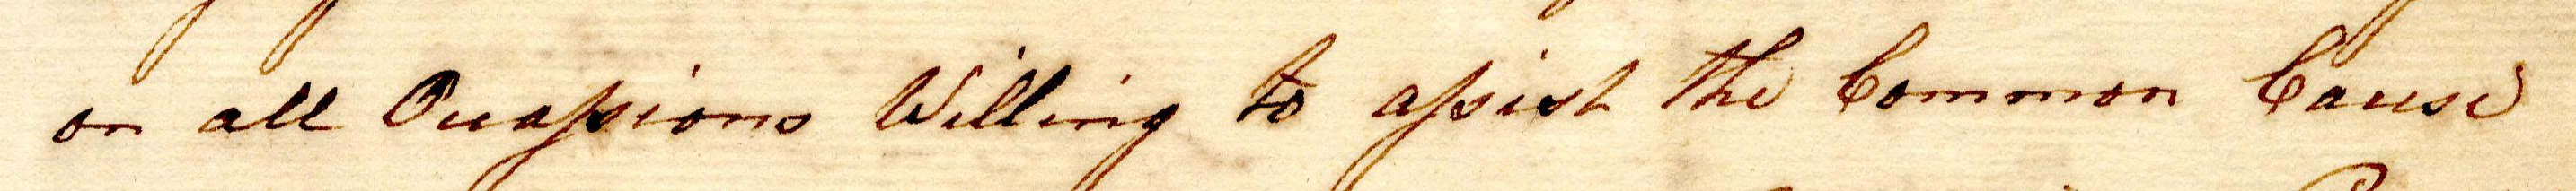on all Occassions Willing to assist the Common Cause
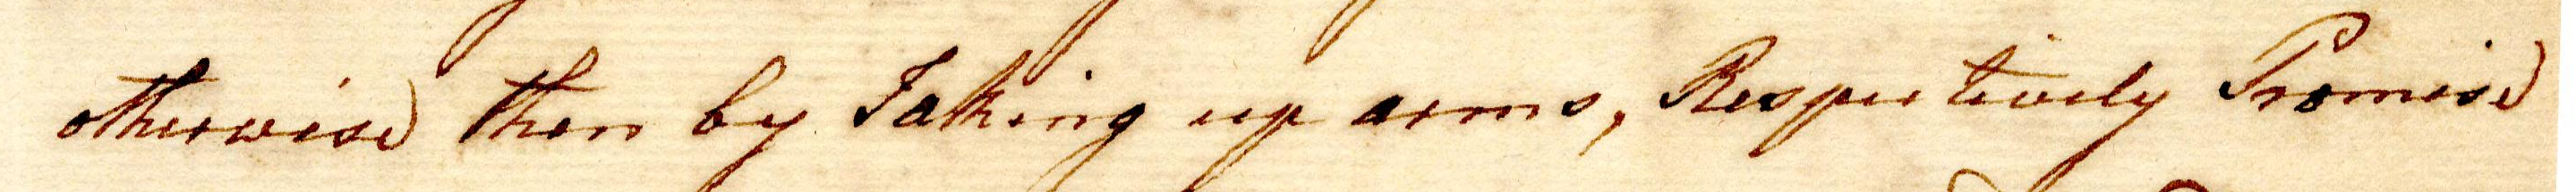otherwise then by Taking up arms, Respectively Promise
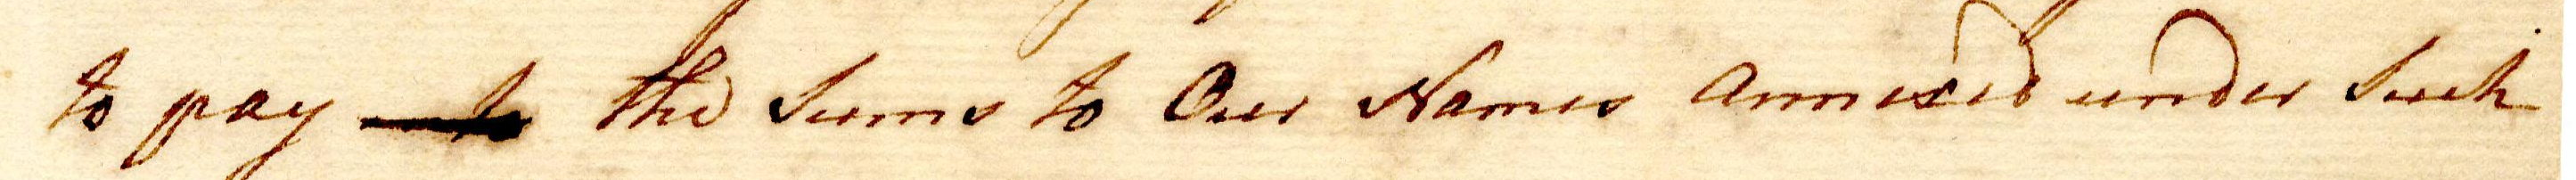to pay the Sums to Our Names Armised under Such
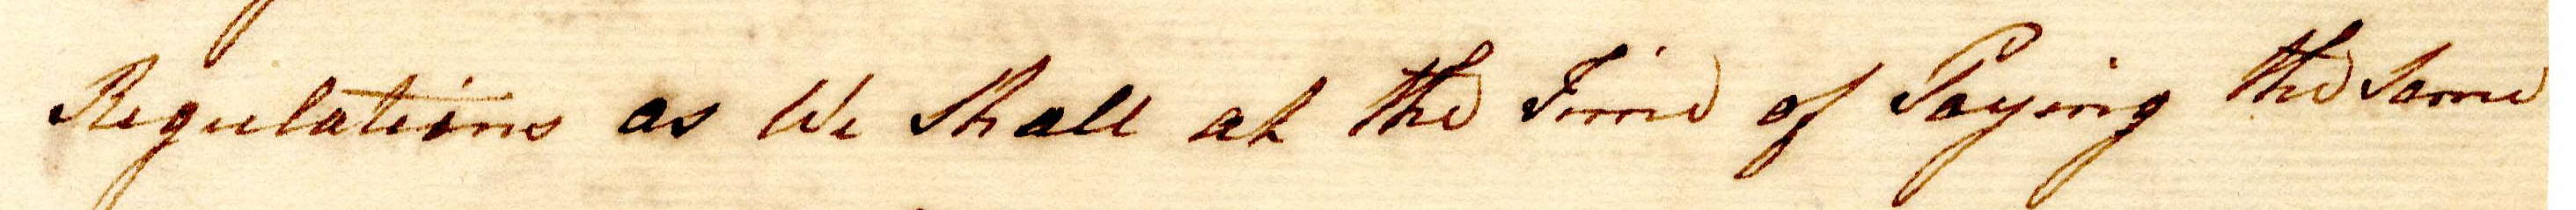Regulations as We shall at the Time of Paying the same
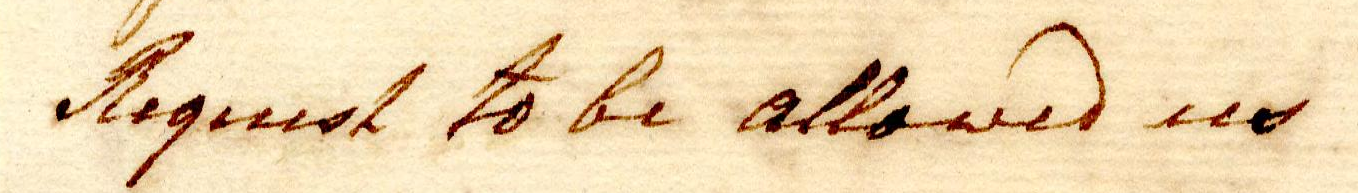Request to be allowed us
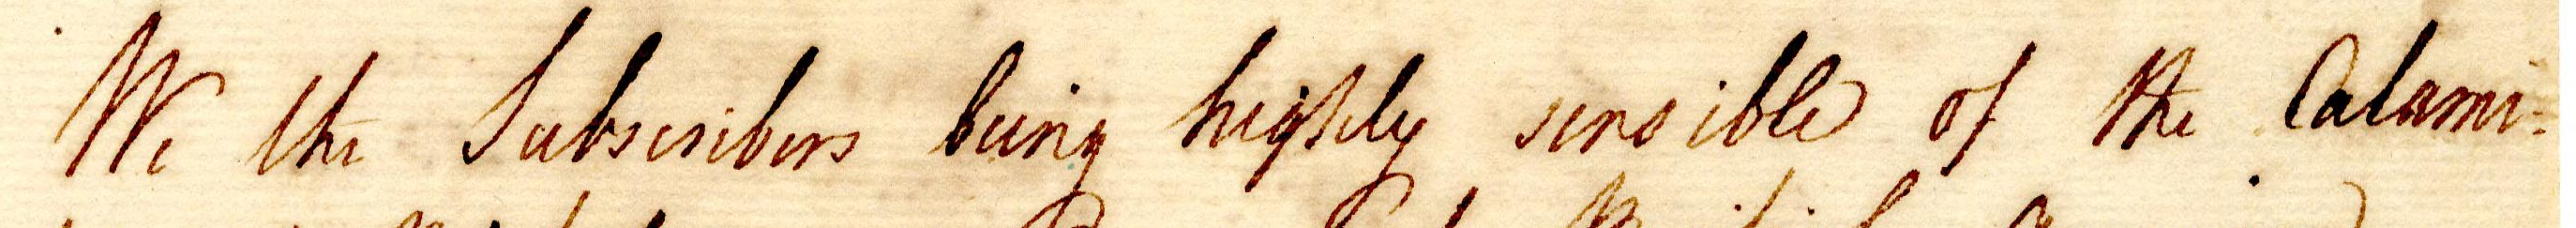We the Subscribers being highly sensible of the Calami-
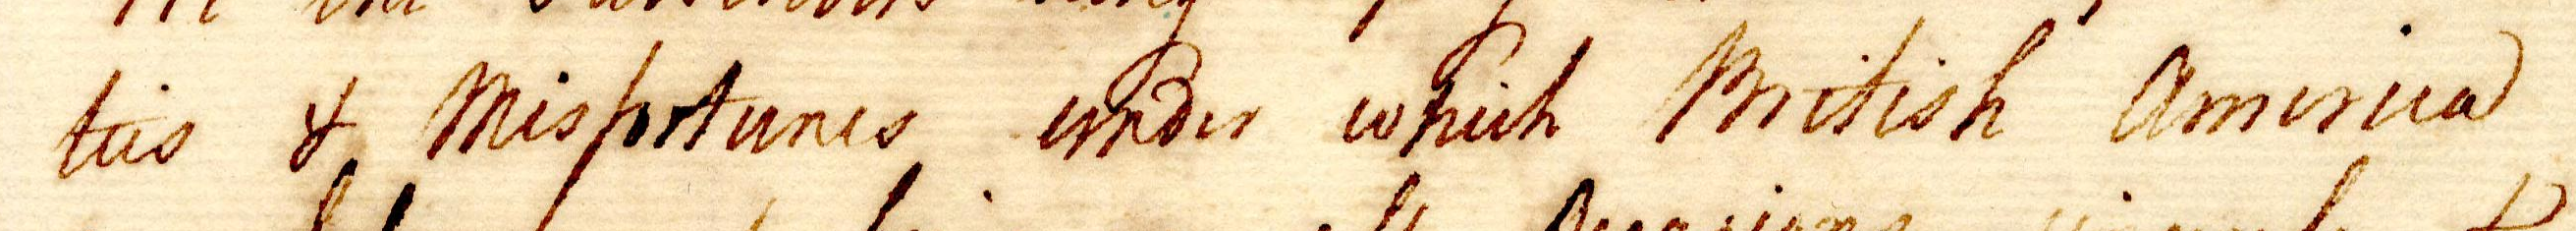-ties & Misfortunes under which British America
